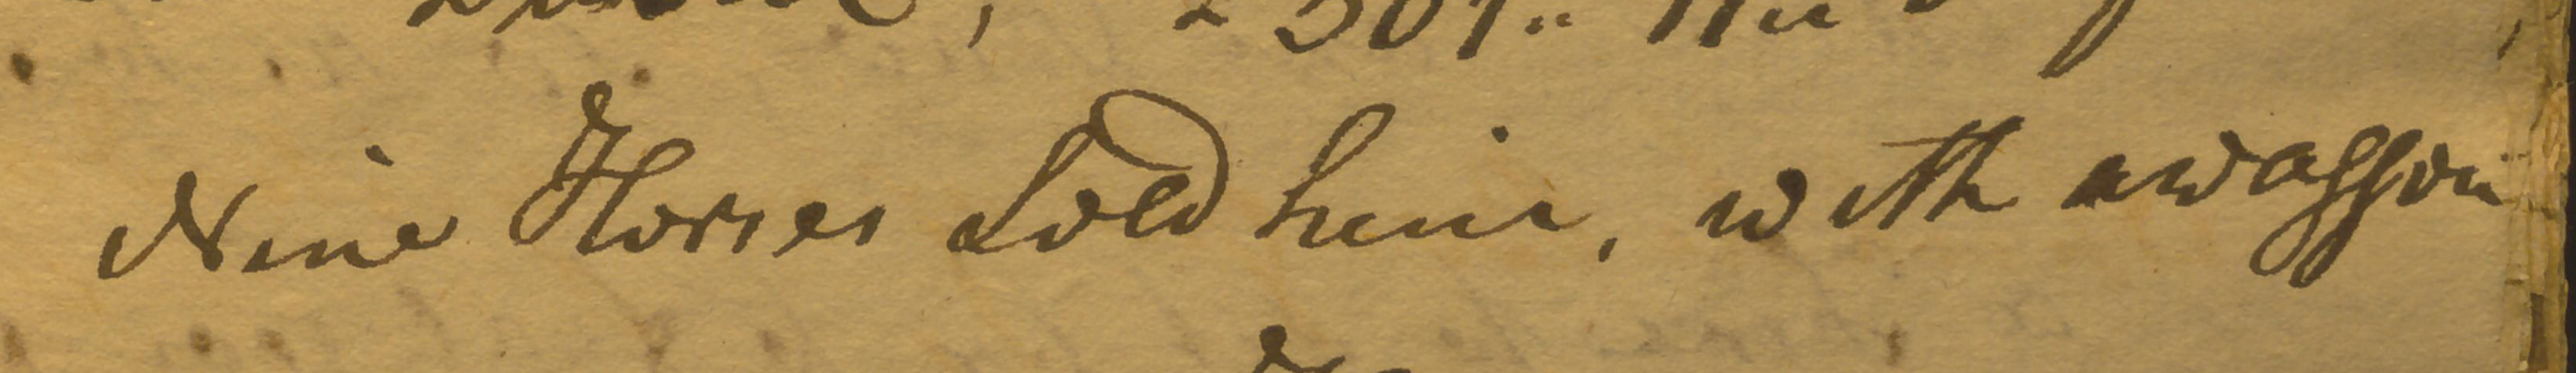Nine Horses sold him, with a waggon
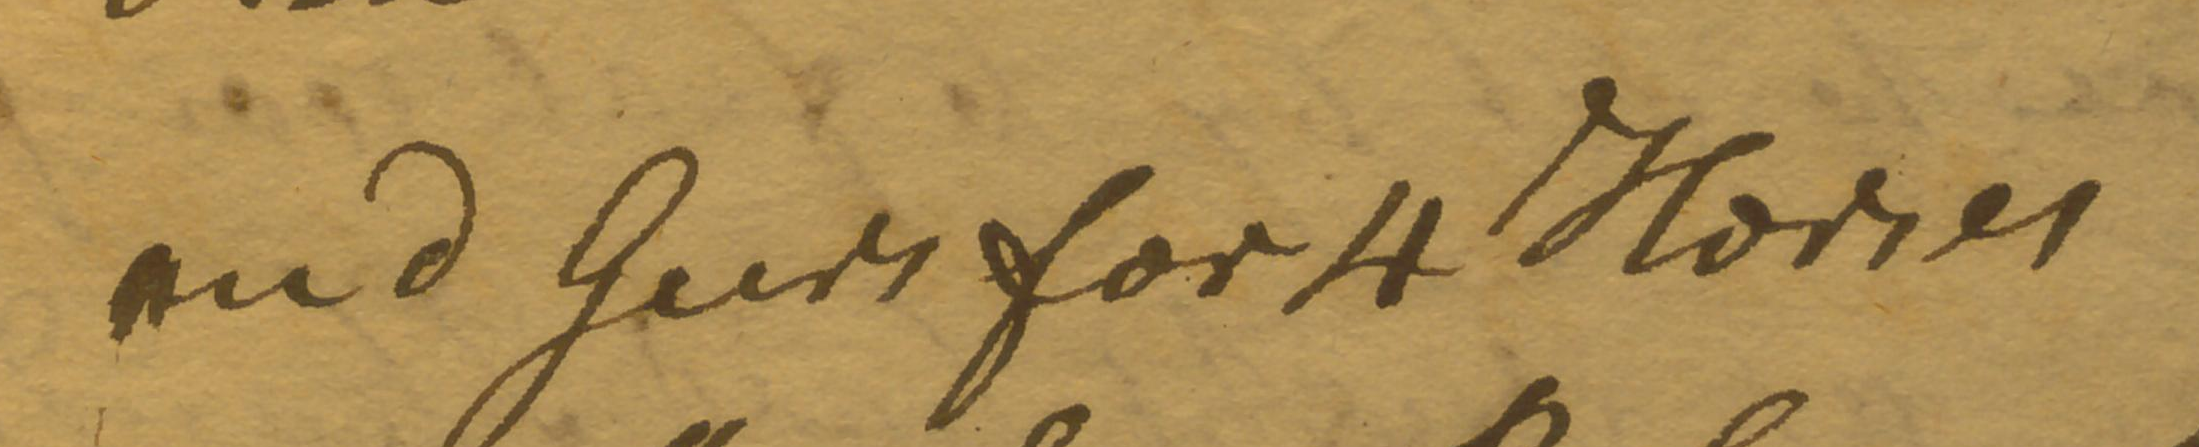and Geers for 4 Horses
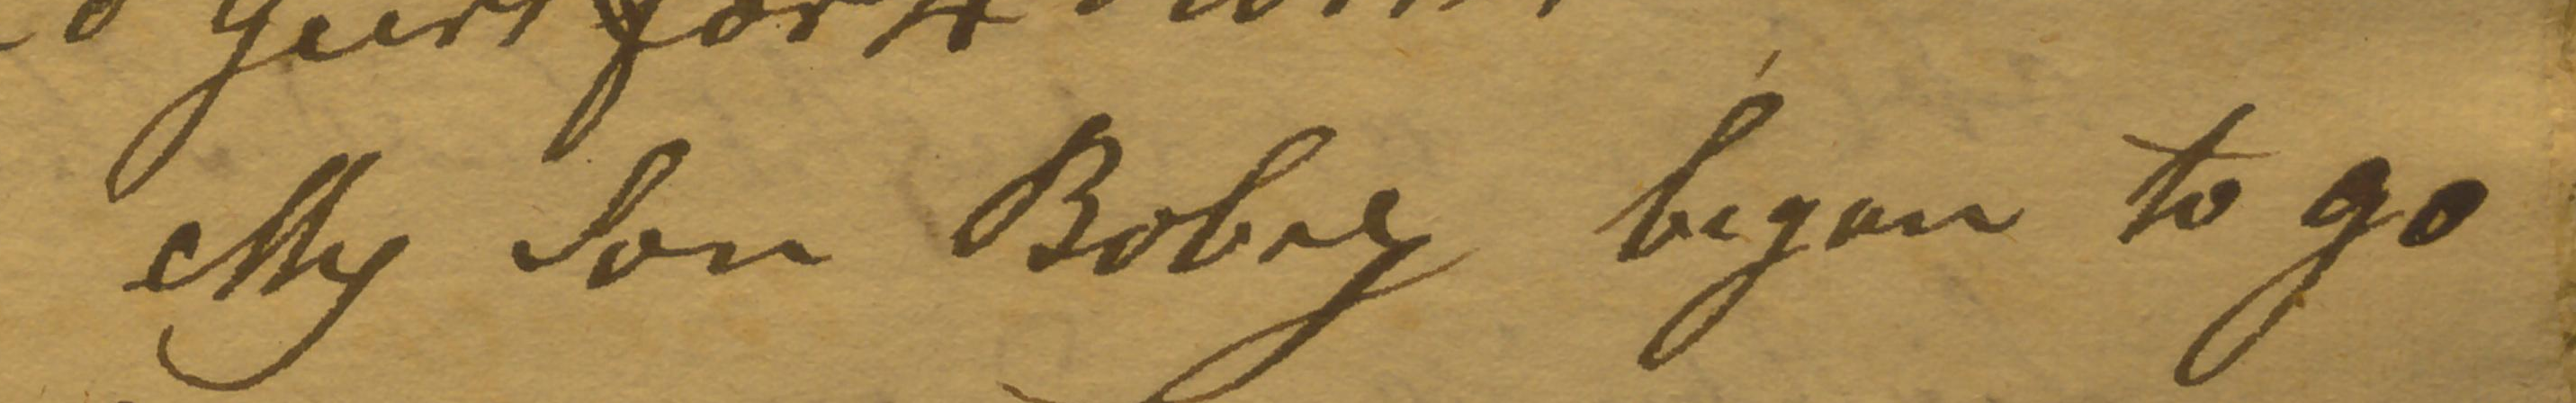My son Bobey began to go
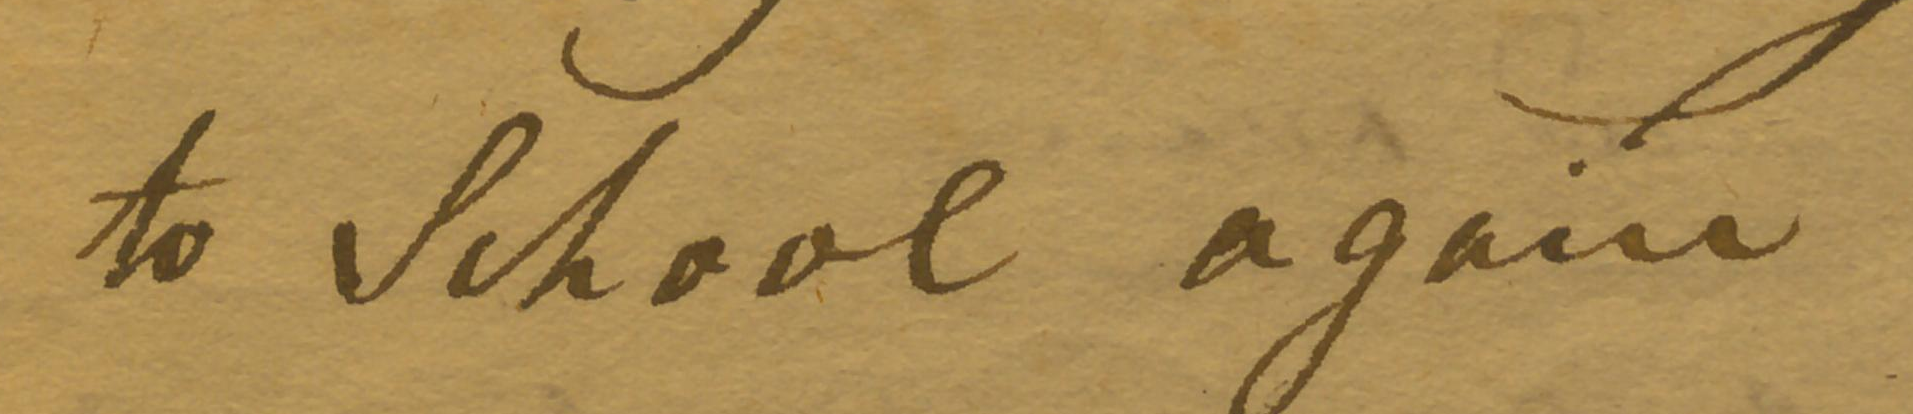to School again
